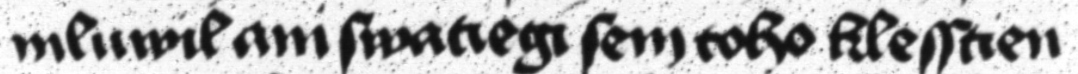mluwil ani ſwatiegí ſem toho kleſſtien
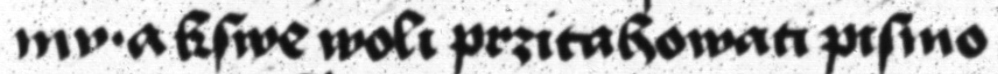my. a kſwe wóli przitahowati píſmo
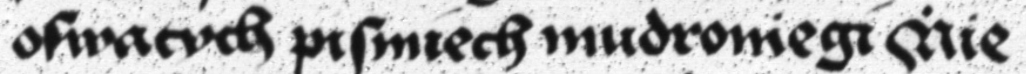oſwatych piſmíech mudroniegí Ṅie
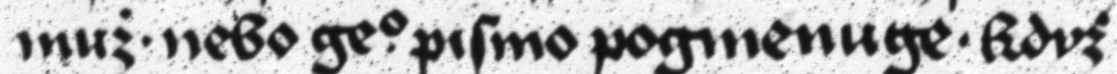muż. nebo ge° píſmo pogmenuge. kdyż
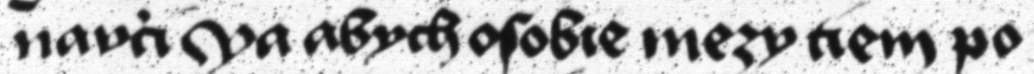navċi Ya abych oſobie mezy tíem po
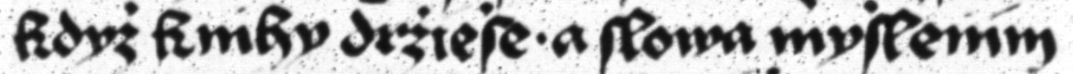kdyż knihy drżíeẛe. a ſlowa myẛlením
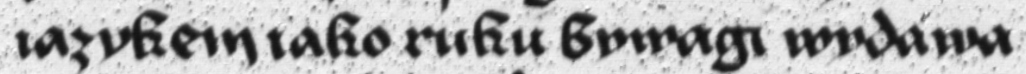iazykem iako ruku bywagí wydawa
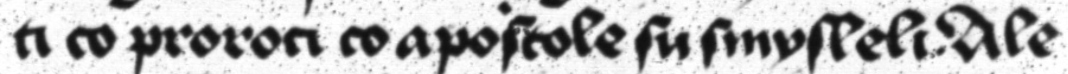ti co proroči co apoẛtolé ſu ſmyſleli. Ale
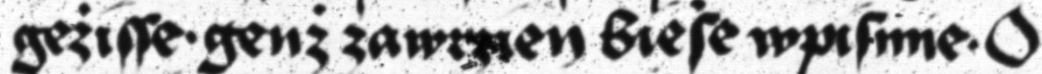geżíſſe. genż zawrzíen bíeẛe wpíſmie. O
